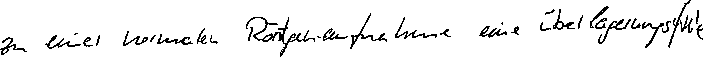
zu einer normalen Röntgenaufnahme eine überlagerungsfreie
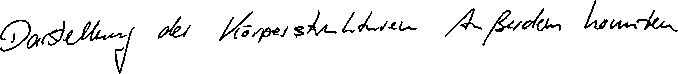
Darstellung der Körperstrukturen. Außerdem konnten
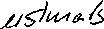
erstmals
